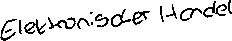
Elektronischer Handel
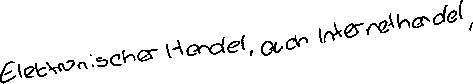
Elektronischer Handel, auch Internethandel,
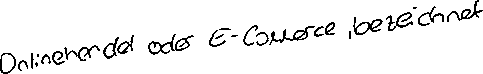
Onlinehandel oder E-Commerce, bezeichnet
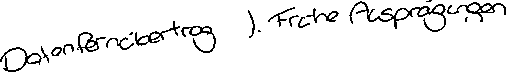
Datenfernübertragung). Frühe Ausprägungen
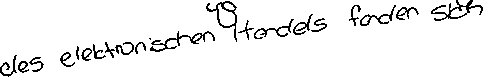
des elektronischen Handels fanden sich
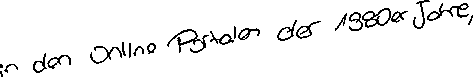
in den Online-Portalen der 1980er Jahre,
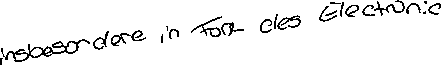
insbesondere in Form des Electronic
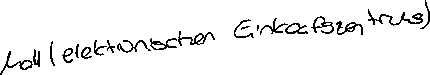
Mall (elektronischen Einkaufszentrums)
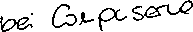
bei Compuserve
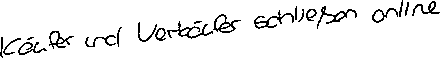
Käufer und Verkäufer schließen online
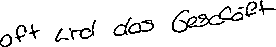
oft wird das Geschäft
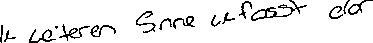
Im weiteren Sinne umfasst der
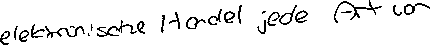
elektronische Handel jede Art von
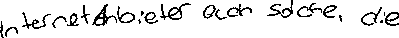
InternetAnbieter auch solche, die
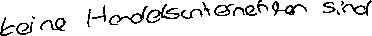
keine Handelsunternehmen sind
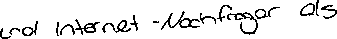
und Internet-Nachfrager als
